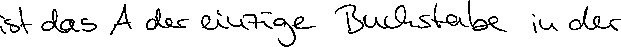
ist das A der einzige Buchstabe in der
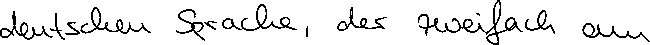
deutschen Sprache, der zweifach am
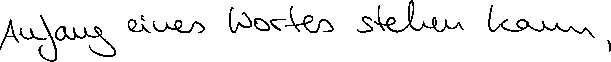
Anfang eines Wortes stehen kann,
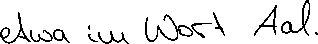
etwa im Wort Aal.
